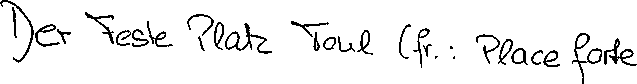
Der Feste Platz Toul (fr.: Place forte
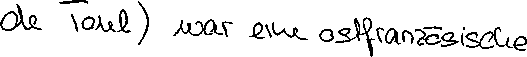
de Toul) war eine ostfranzösische
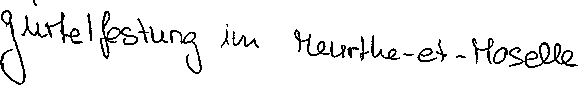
Gürtelfestung im Meurthe-et-Moselle
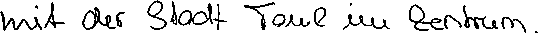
mit der Stadt Toul im Zentrum.
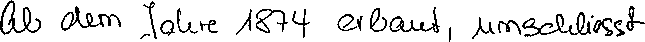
Ab dem Jahre 1874 erbaut, umschließt
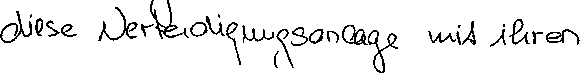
diese Verteidigungsanlage mit ihren
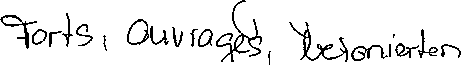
Forts, Ouvrages, betonierten
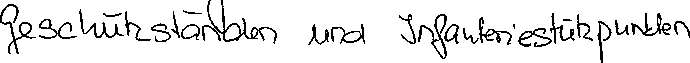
Geschützstän den und Infanteriestützpunkten
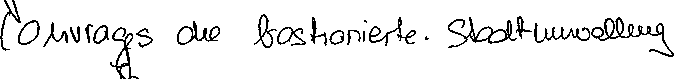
(Ouvrages die bastionierte Stadtumwallung
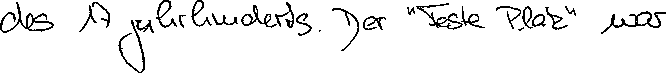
des 17. Jahrhunderts. Der "Feste Platz" war
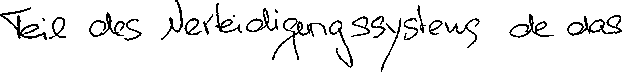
Teil des Verteidigungssystems de das
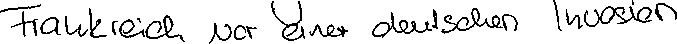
Frankreich vor einer deutschen Invasion
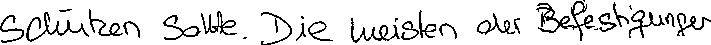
schützen sollte. Die meisten der Befestigungen
